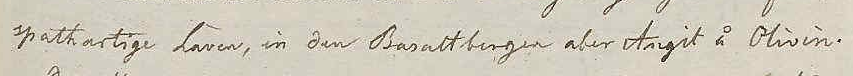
spathartige Laven, in den Basaltbergen aber Augit u Olivin.
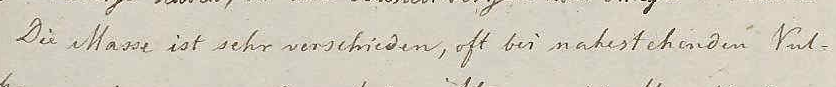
Die Masse ist sehr verschieden, oft bei nahestehenden Vul-
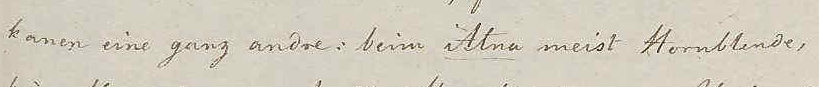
kanen eine ganz andre: beim Ätna meist Hornblende,
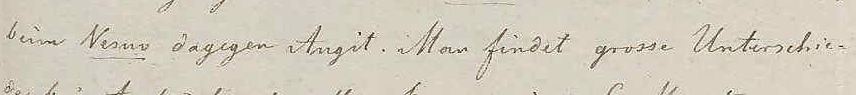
beim Vesuv dagegen Augit. Man findet grosse Unterschie-
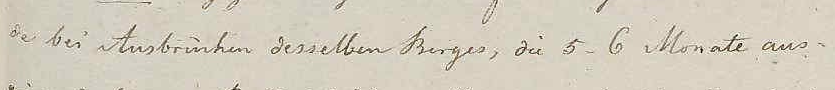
de bei Ausbrüchen desselben Berges, die 5–6 Monate aus-
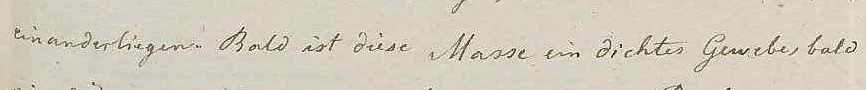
einanderliegen. Bald ist diese Masse ein dichtes Gewebe, bald
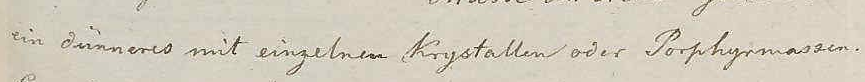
ein dünneres mit einzelnen Krystallen oder Porphyrmassen.
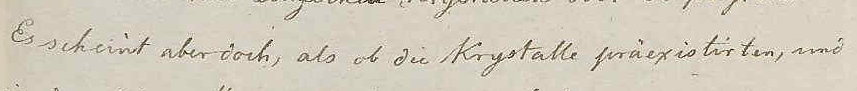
Es scheint aber doch, als ob die Krystalle präexistirten, und
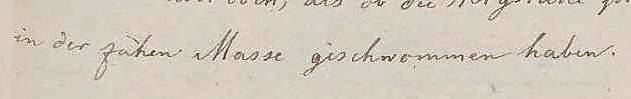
in der zähen Masse geschwommen haben.
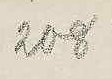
Der lezte
